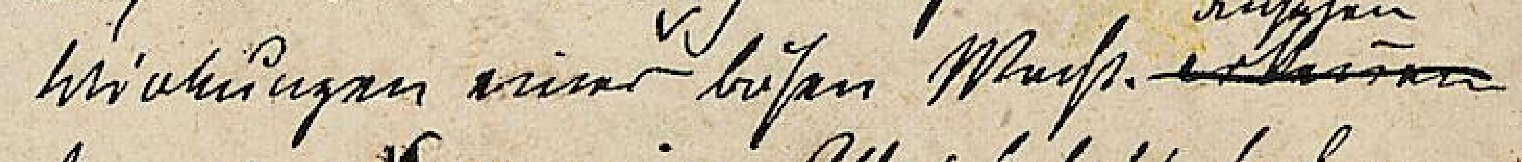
Wirkungen einer bösen Macht
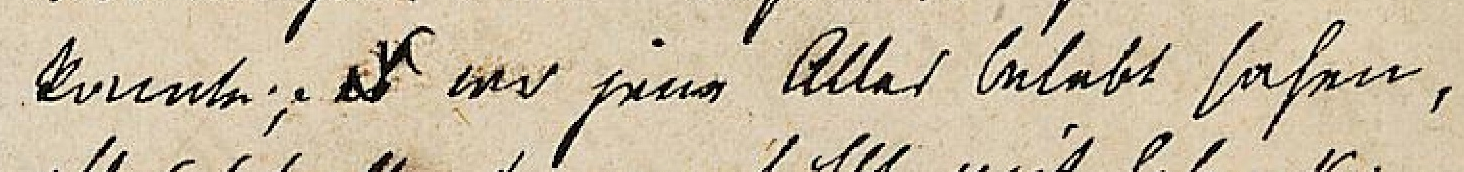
konnte; es wo jener Alles belebt sahen,
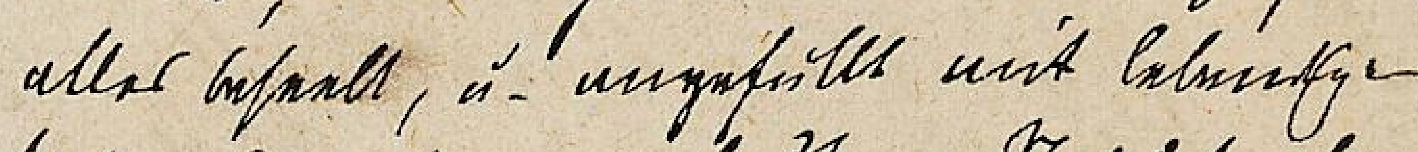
alles beseelt, u. angefüllt mit lebendigen
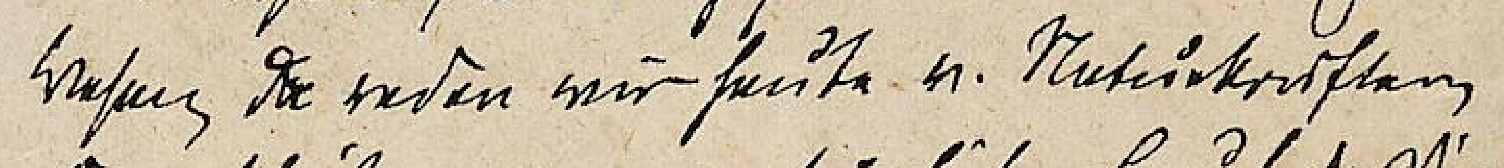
Wesen, da reden wir heut v. Naturkräften,
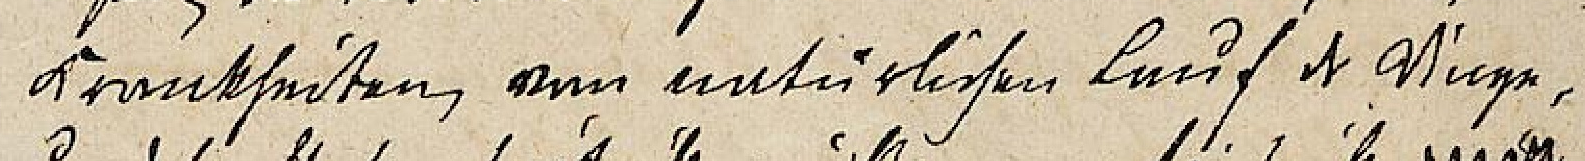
Krankheiten, am natürlichen Lauf dr Dinge
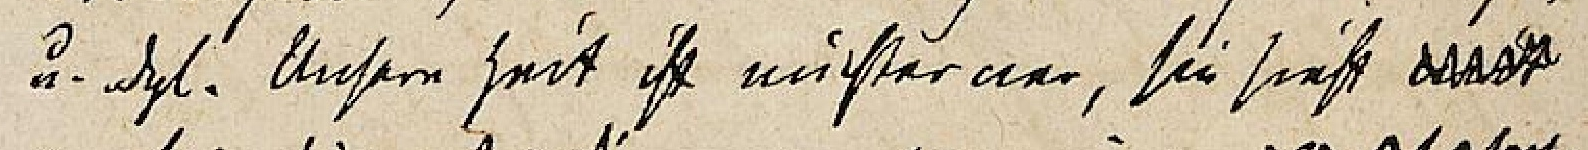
u. dgl. Unsere Zeit ist nüchterner, sie sieht was
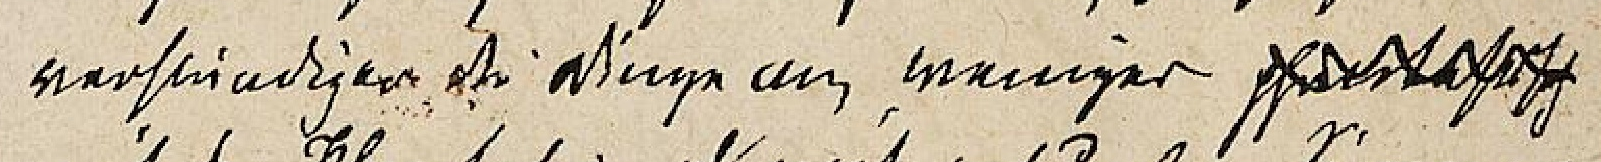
verständiger die Dinge an, weniger phantastisch
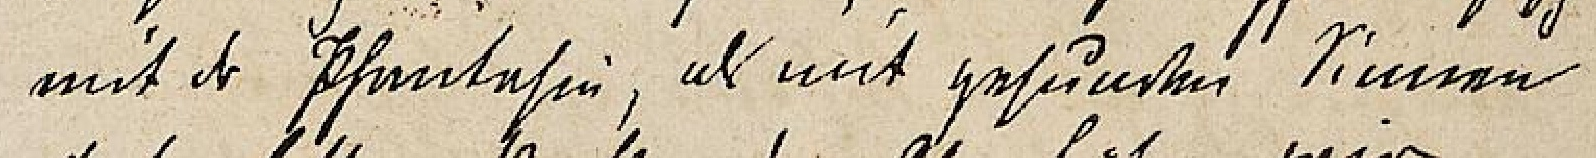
mit der Phantasie, als mit gesunden Sinnen
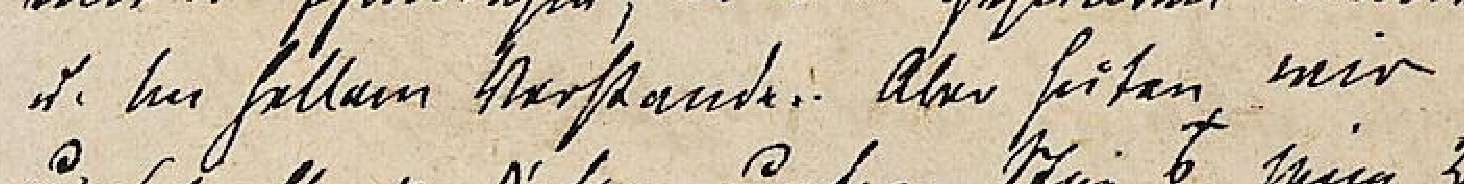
u 1m hellen Verstande. Aber hüten wir
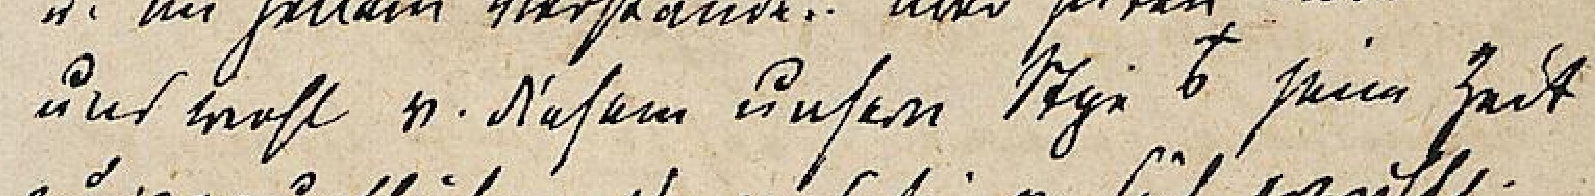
uns wohl v. disem unsern Nyn s jener Zeit
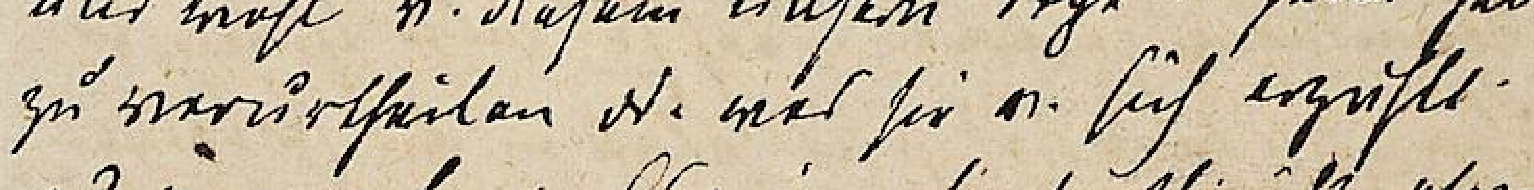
zu verurtheilen od. was sie v. sich erzählt
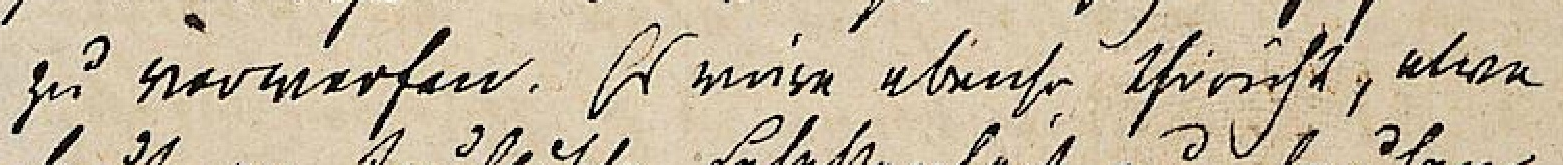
zu verwerfen. Es wäre ebenso thöricht, etwa
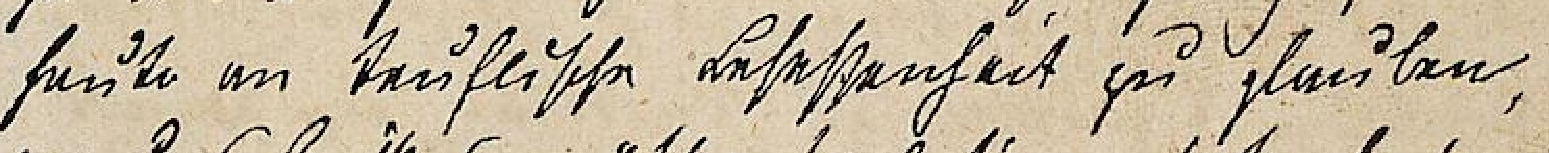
heute an teuflische Besessenheit zu glauben,
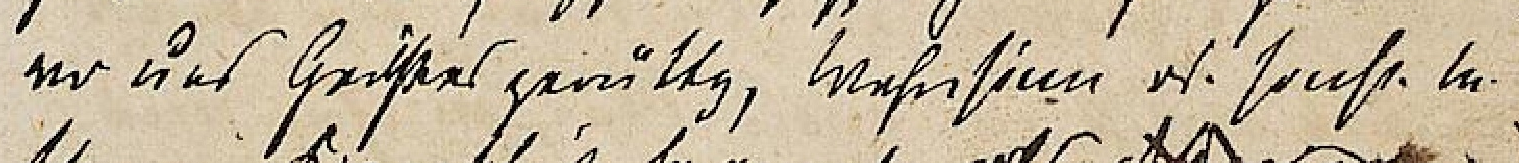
wo uns Geistesgerättg, Wahnsinn od. sonst 1n
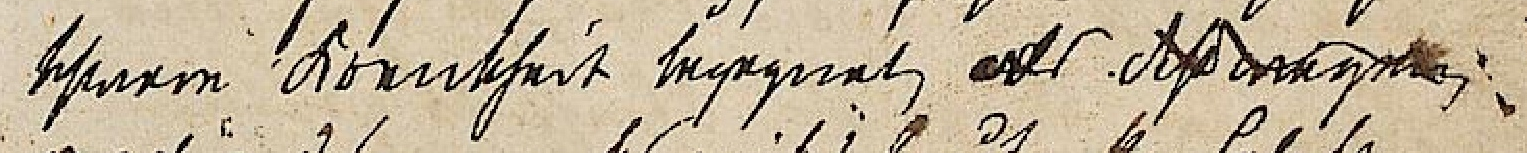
schwere Krankheit begenet, oder daß wenigs
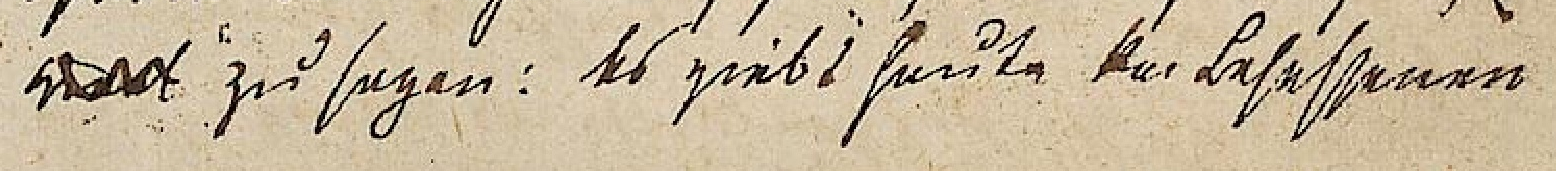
wird zu sagen: es giebt heute kn Besessenen
